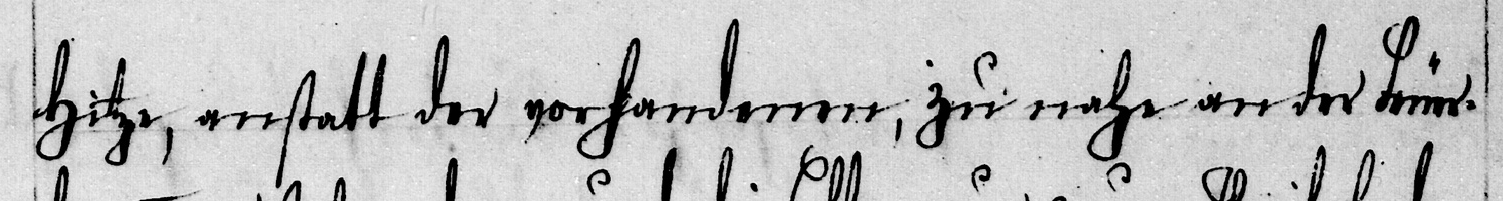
Hitze, anstatt der vorhandenen, zu nahe an der Feuer¬
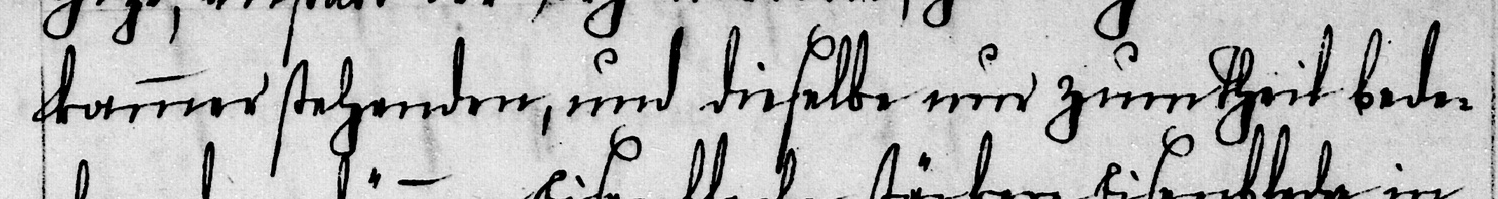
kammer stehenden, und dieselbe nur zum Theil bede¬
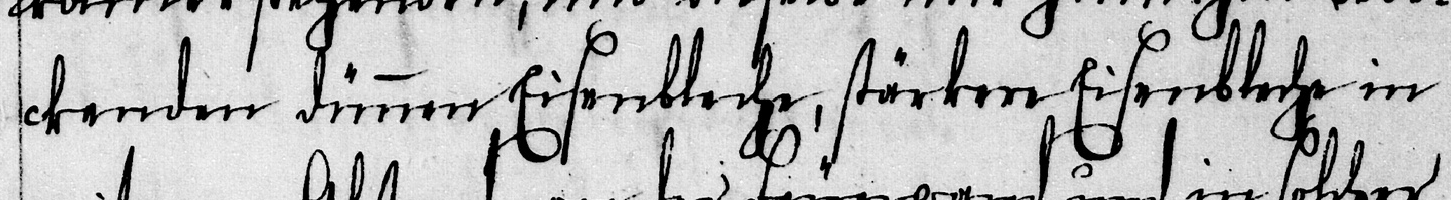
ckenden dünnen Eisenbleche, stärkere Eisenbleche in
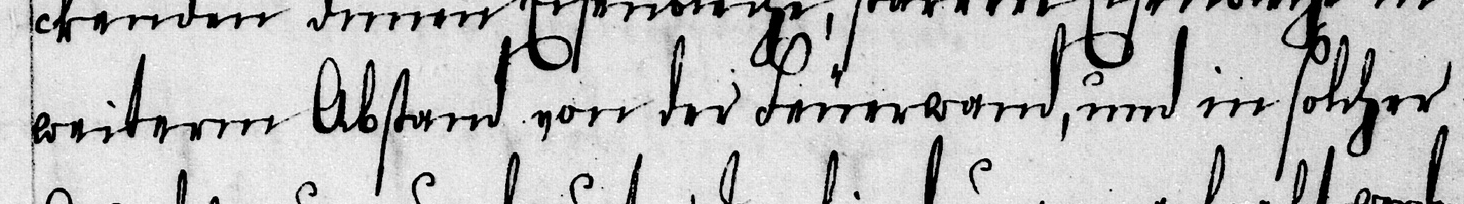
weiterm Abstand von der Feuerwand, und in solcher
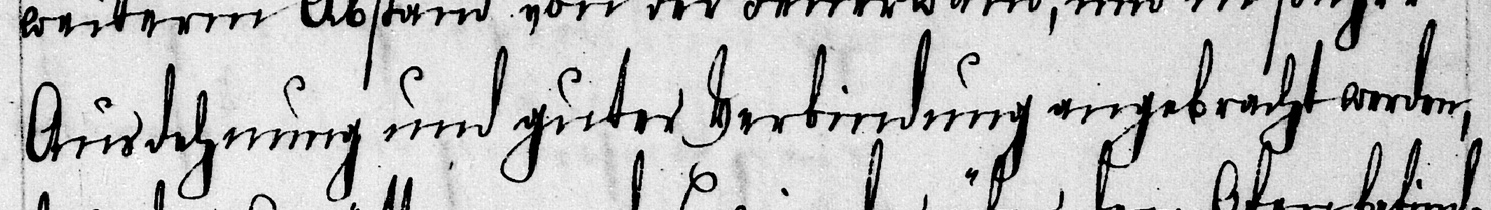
Ausdehnung und guter Verbindung angebracht werden,
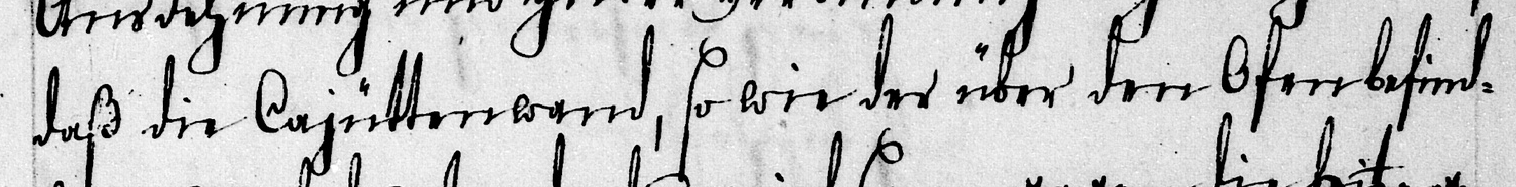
daß die Cajüttenwand, so wie der über den Ofen befind¬
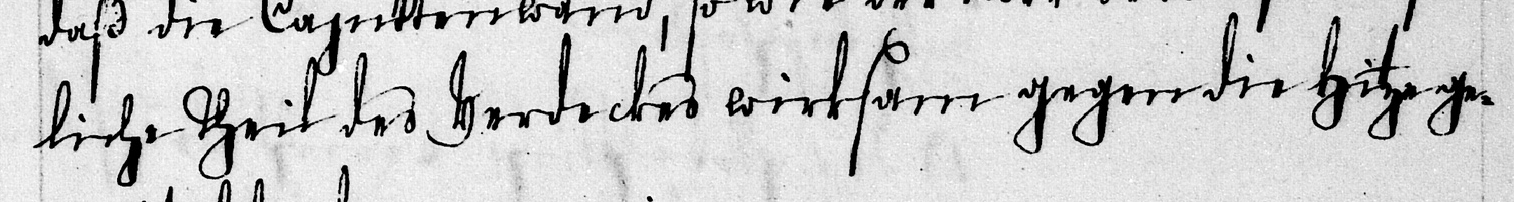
liche Theil des Verdeckes wirksam gegen die Hitze ge¬
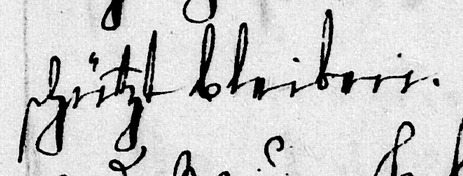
schützt bleiben.
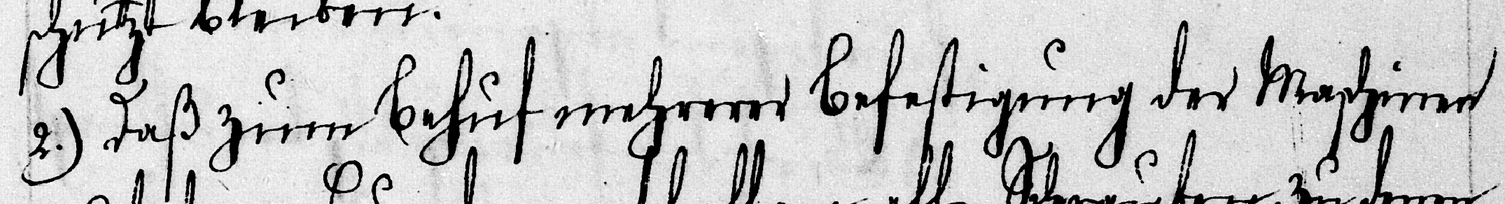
2.) Daß zum Behuf mehrerer Befestigung der Maschinen
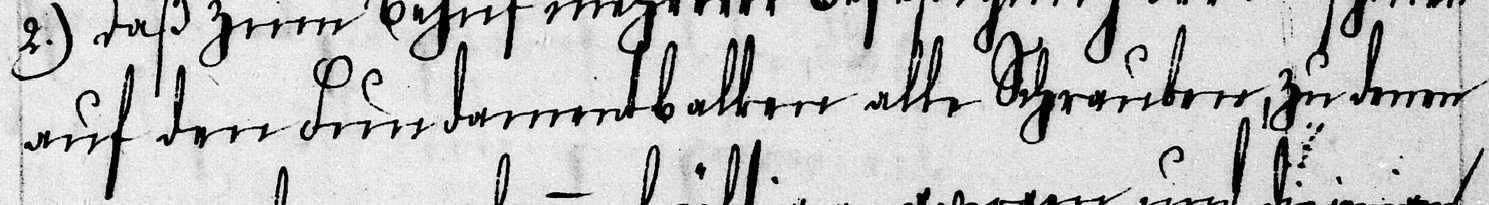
auf den Fundamentbalken alle Schrauben, zu denen
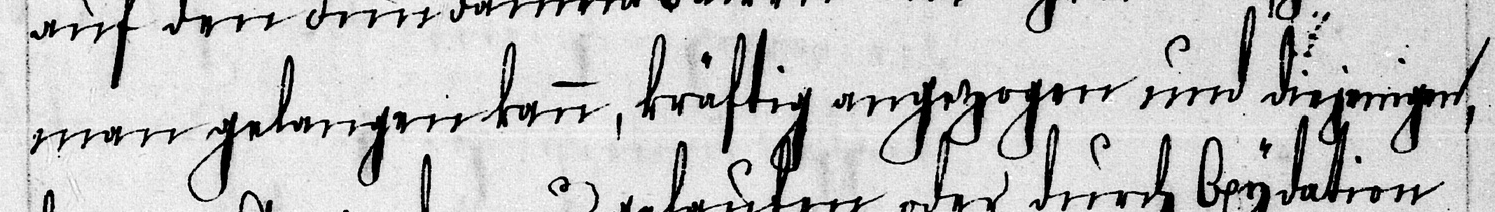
man gelangen kann, kräftig angezogen und diejenigen,
